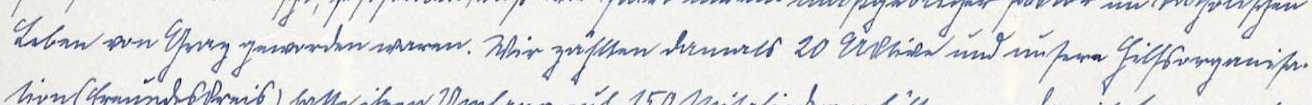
Leben von Graz geworden waren. Wir zählten damals 20 Aktive und unsere Hilfsorganisa-
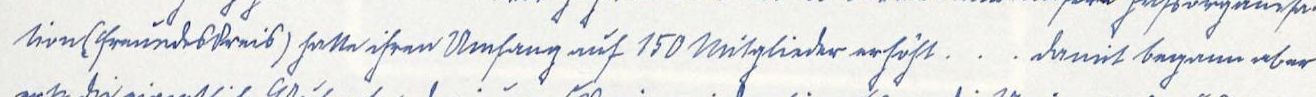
tion (Freundeskreis) hatte ihren Umfang auf 150 Mitglieder erhöht...Damit begann aber
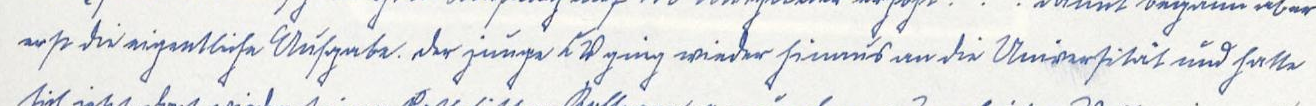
erst die eigentlich Aufgabe. Der junge CV ging wieder hinaus an die Universität und hatte
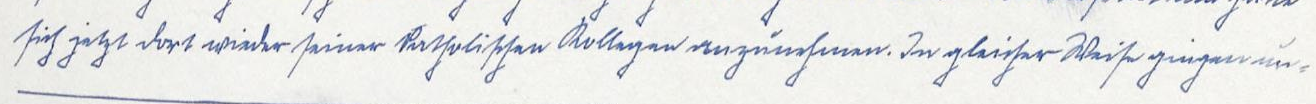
sich jetzt dort wieder seiner katholischen Kollegen anzunehmen. In gleicher Weise gingen un-
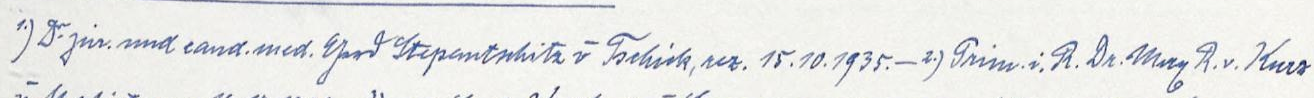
1) iur und cand. med er Stepantschitz v/o Tschick, rez. 15. 10. 1935.- 2) Prim. i. R. Dr. Max R. v. Kurz
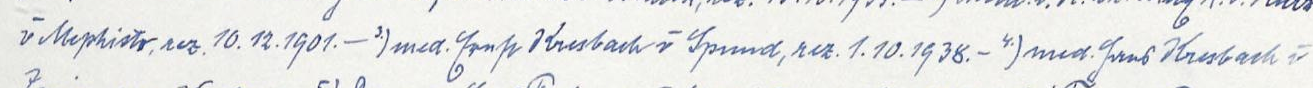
v/o Mephisto, rez. 10. 12.1901.- 3) med. Ernst Kresbach v/o Spund, rez. 1.10. 1938.- 4) med. Hans Kresbach v/o
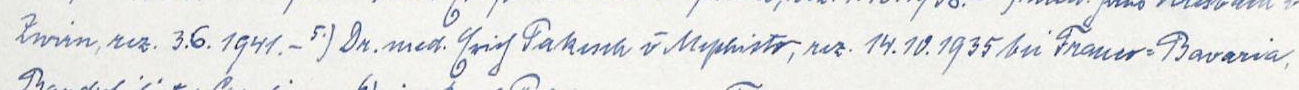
Zwin, rez. 3. 6. 1941. - 5) Dr. med. Erich Pakesch v/o. Mephisto, rez. 14. 10. 1935 bei Franco- Bavaria,
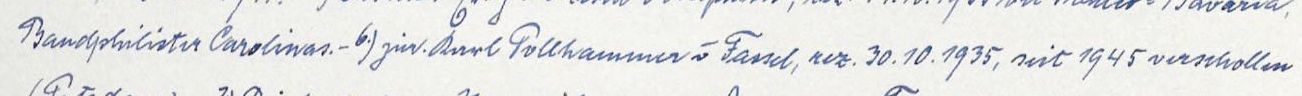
Bandphilister Carolinas. - 6) iur. Karl Pollhammer v/o Fassel, rez. 30. 10. 1935, seit 1945 verschollen
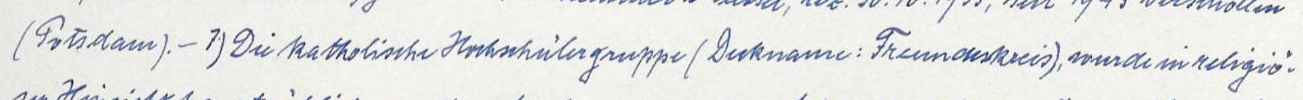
(Potsdam).- 7) Die katholische Hochschülergruppe (Decknanme: Freuunedeskreis, wurde in religiö-
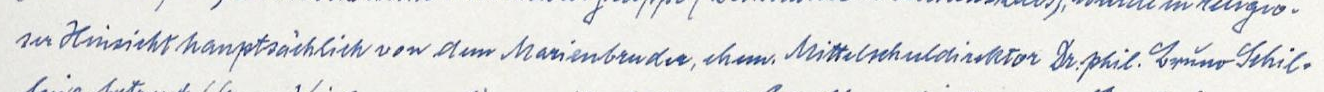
ser Hinsicht hauptsächlich von dem Marienbruder, ehem Mitelschuldirektor Dr. phil. Bruno Schil-
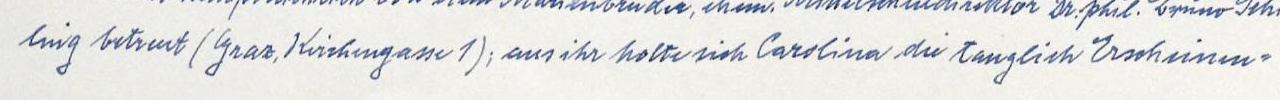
ling betreut (Graz, Kirchengasse 1) aus ihr holte sich Carolina die tauglich Erscheinen-
